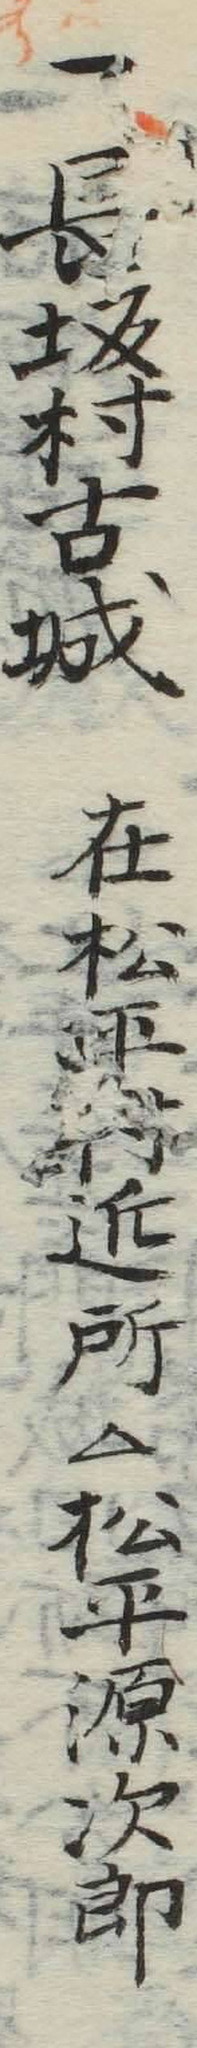一長坂村古城在松平村近所△松平源次郎
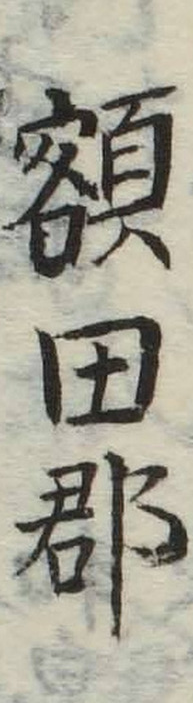額田郡

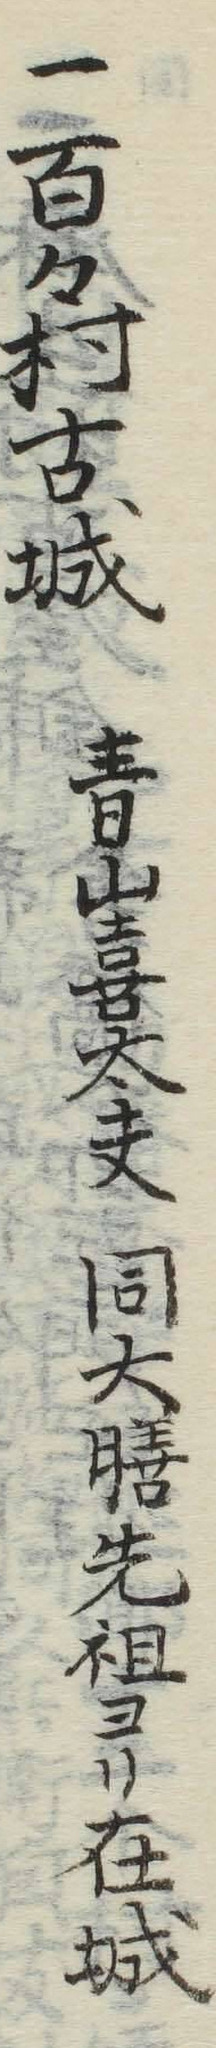一百々村古城青山喜太夫同大膳先祖ヨリ在城
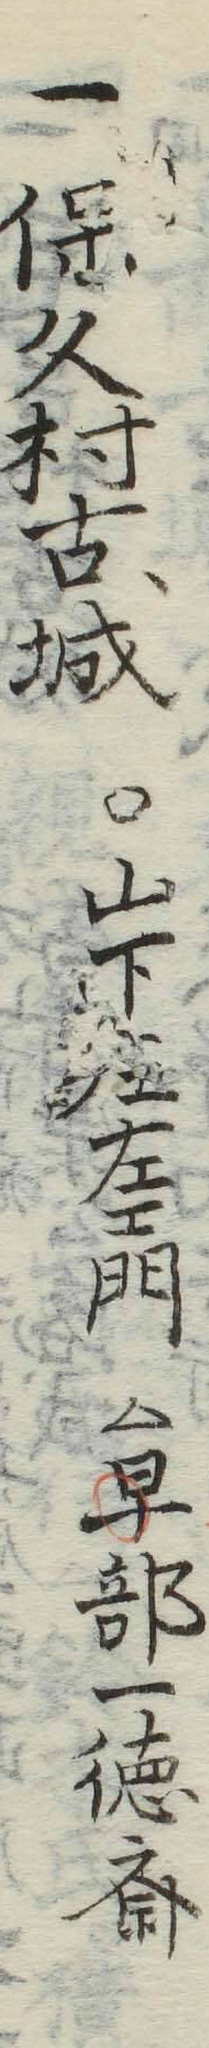一保久村古城○山下庄左エ門△早部一徳斎
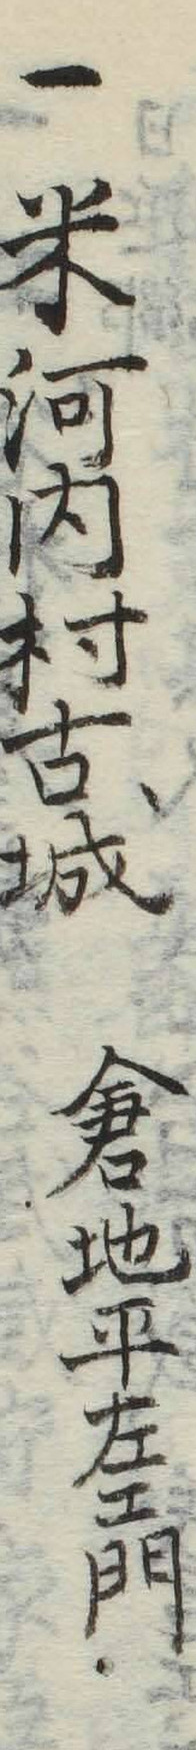一米河内村古城倉地平左エ門
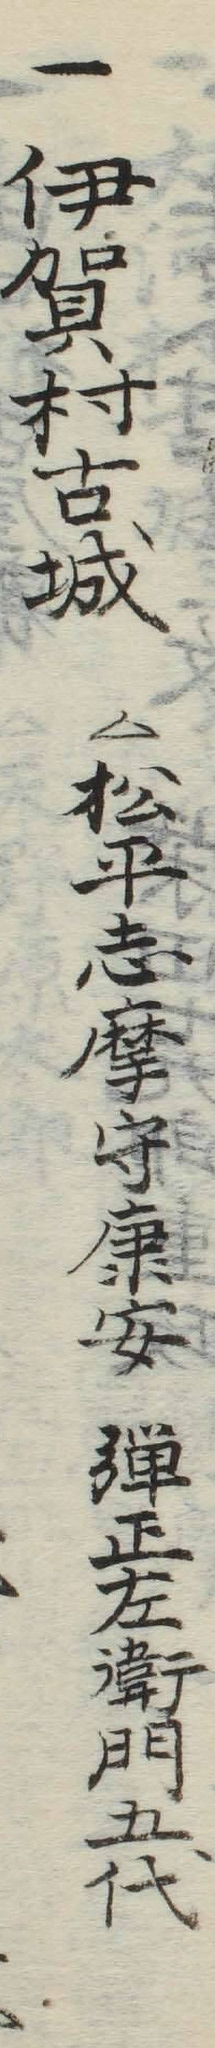一伊賀村古城△松平志摩守康安禅正左衛門五代
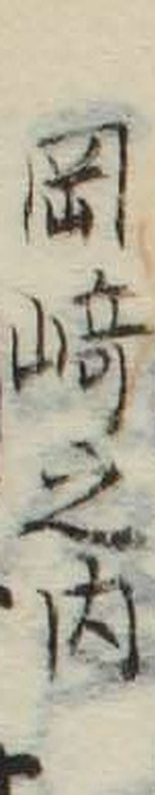岡崎之内
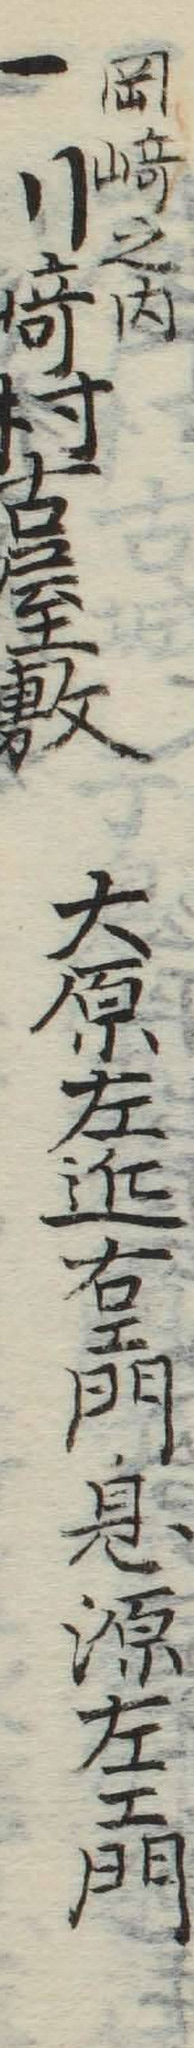一川崎村古屋敷大原左近右エ門息源左エ門

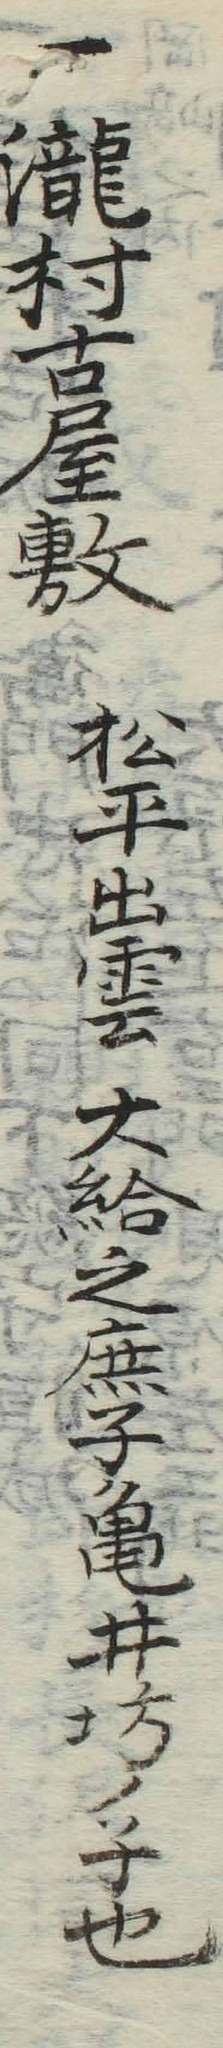一瀧村古屋敷松平出雲大給之庶子亀井坊ノ子也
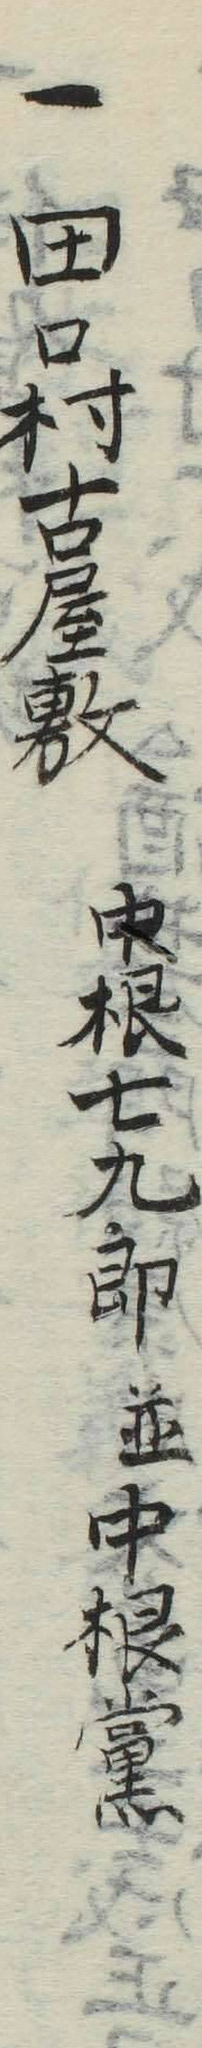一田口村古屋敷中根七九郎並中根党
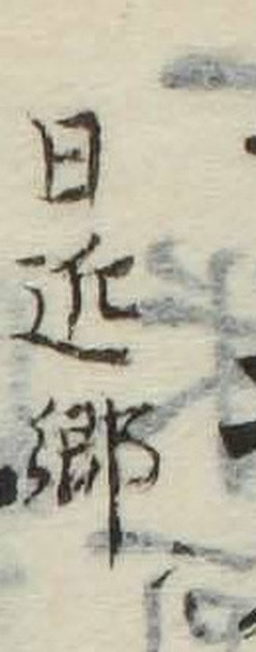日近郷
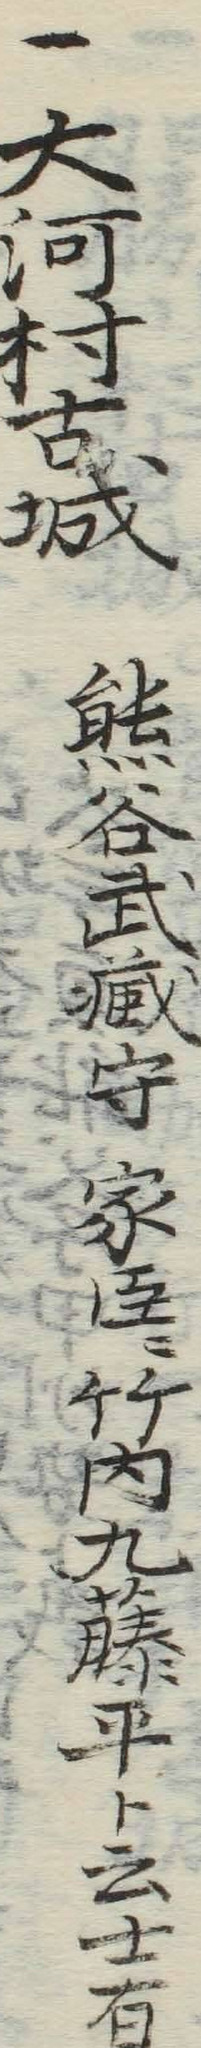一大河村古城熊谷武蔵守家臣ニ竹内九藤平ト云士有

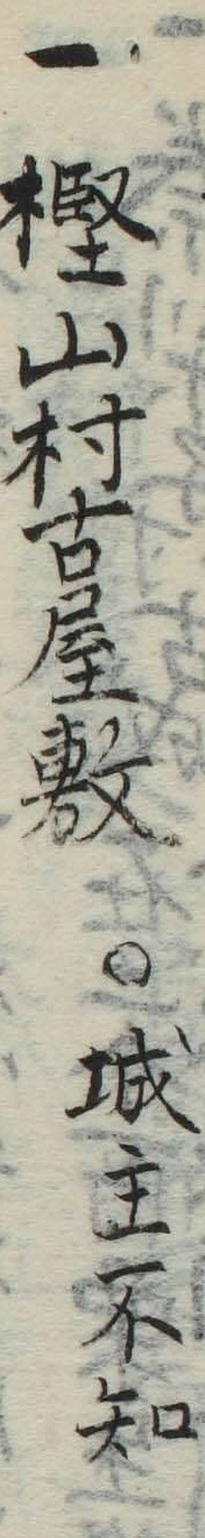一樫木村古屋敷○城主不知
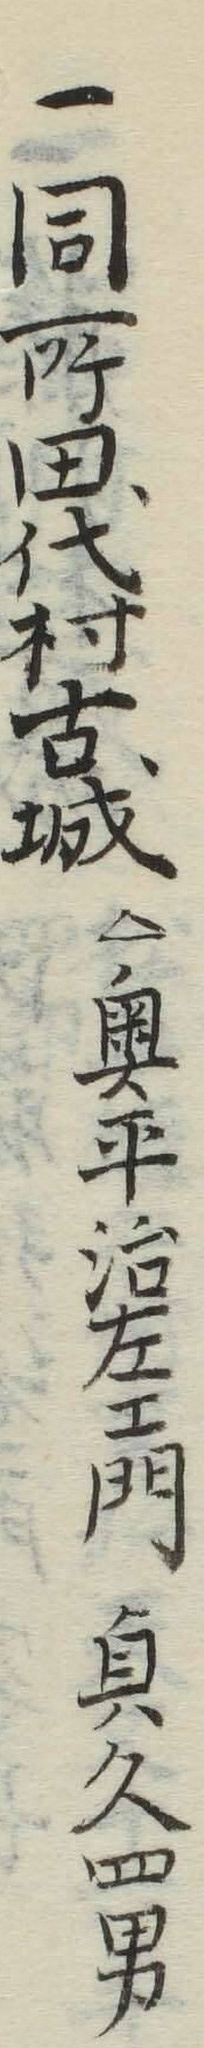一同所田代村古城△奥平治左エ門貞久四男
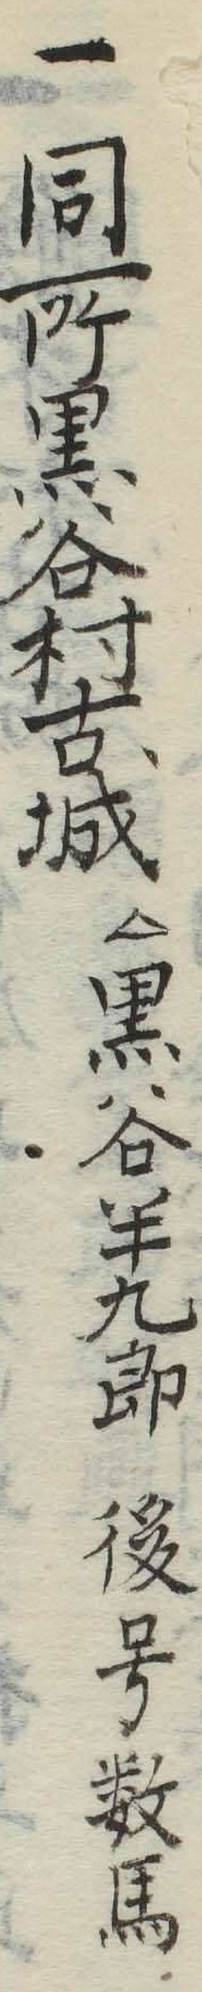一同所黒谷村古城△黒谷半九郎後号数馬

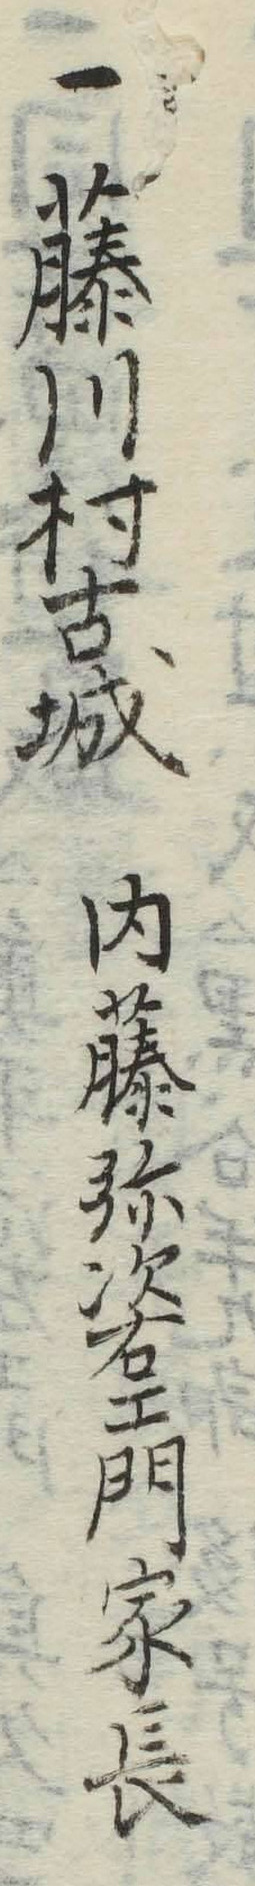一藤川村古城内藤弥次右エ門家長
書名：三河国二葉松
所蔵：国文学研究資料館
